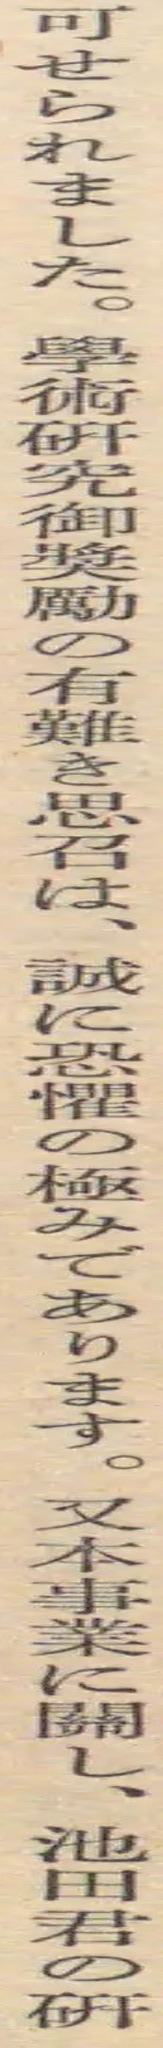可せられました。學術硏究御奬勵の有難き思召は、誠に恐懼の極みであります。又本事業に關し、池田君の硏
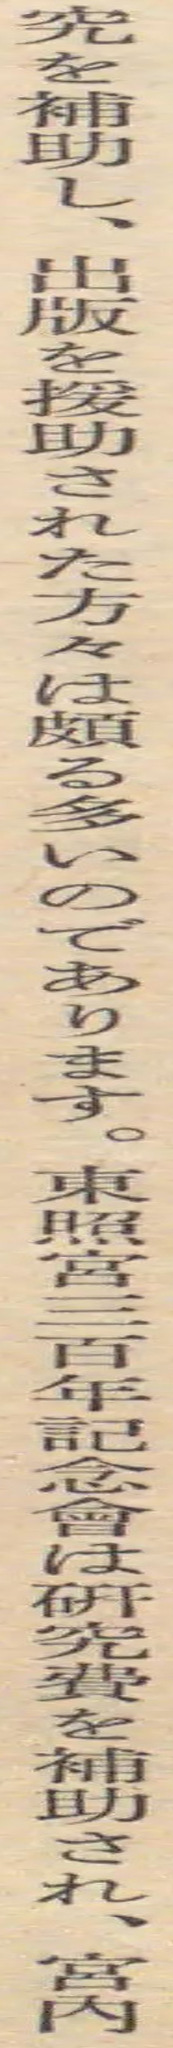究を補助し、出版を援助された方々は頗る多いのであります。東照宮三百年記念會は硏究費を補助され、宮内
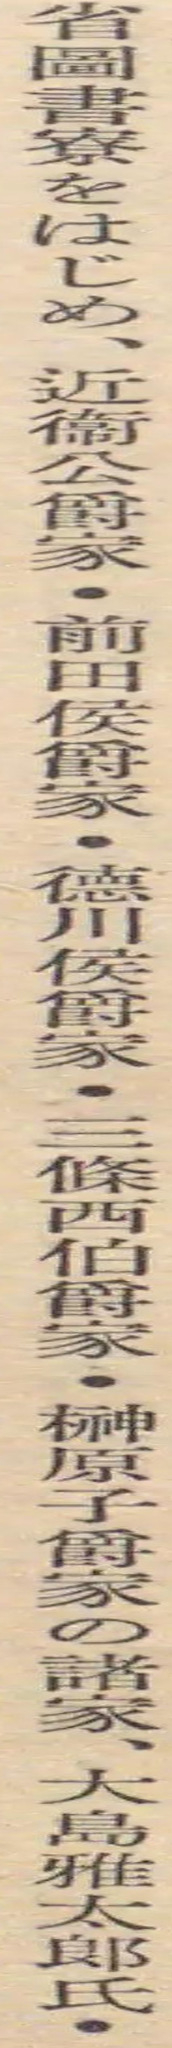省圖書寮をはじめ、近衞公爵家・前田侯爵家・德川侯爵家・三條西伯爵家・榊原子爵家の諸家、大島雅太郎氏・

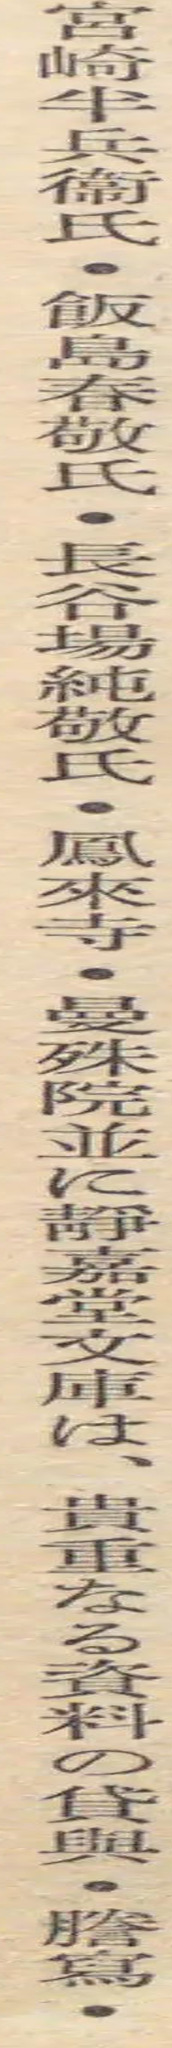宮崎半兵衞氏・飯島春敬氏・長谷場純敬氏・鳳來寺・曼殊院並に靜嘉堂文庫は、貴重なる資料の貸與・謄寫・
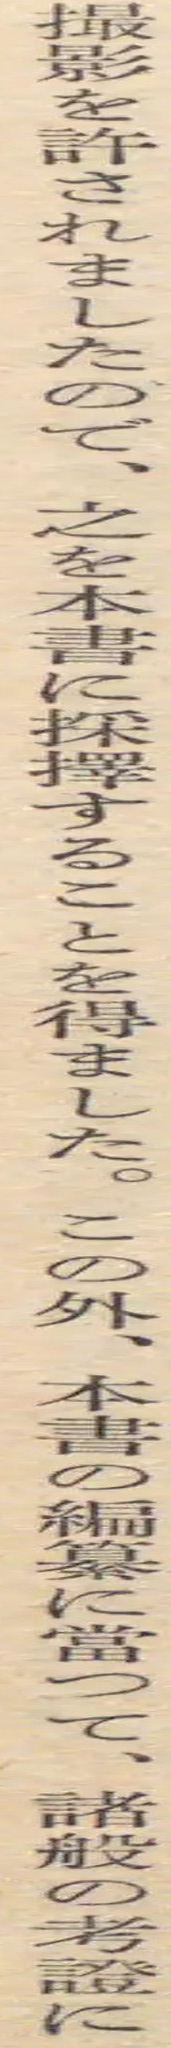撮影を許されましたので、之を本書に採擇することを得ました。この外、本書の編纂に當つて、諸般の考證に
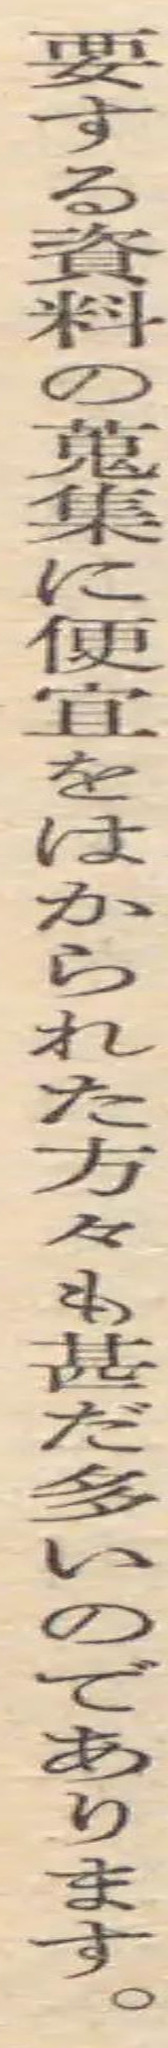要する資料の蒐集に便宜をはかられた方々も甚だ多いのであります。
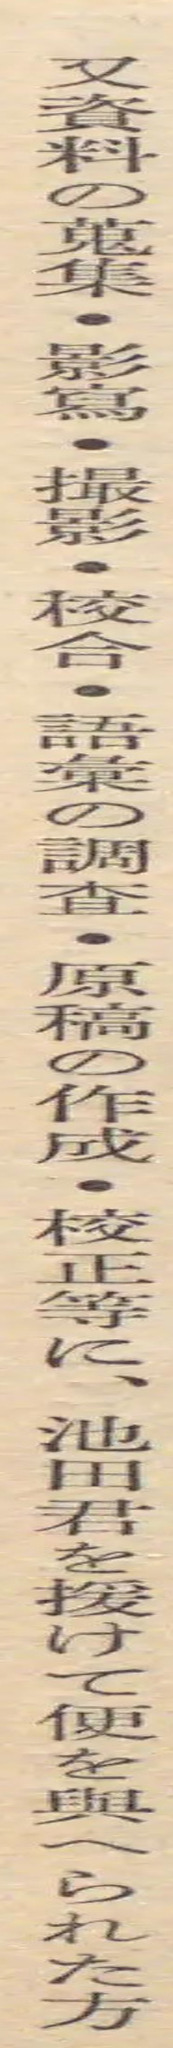又資料の蒐集・影寫・撮影・校合・語彙の調査・原稿の作成・校正等に、池田君を援けて便を與へられた方
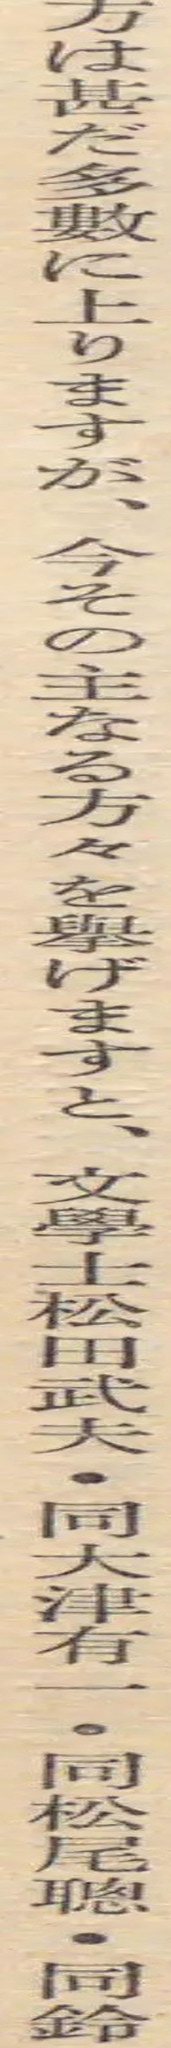方は甚だ多數に上りますが、今その主なる方々を擧げますと、文學士松田武夫・同大津有一・同松尾聰・同鈴
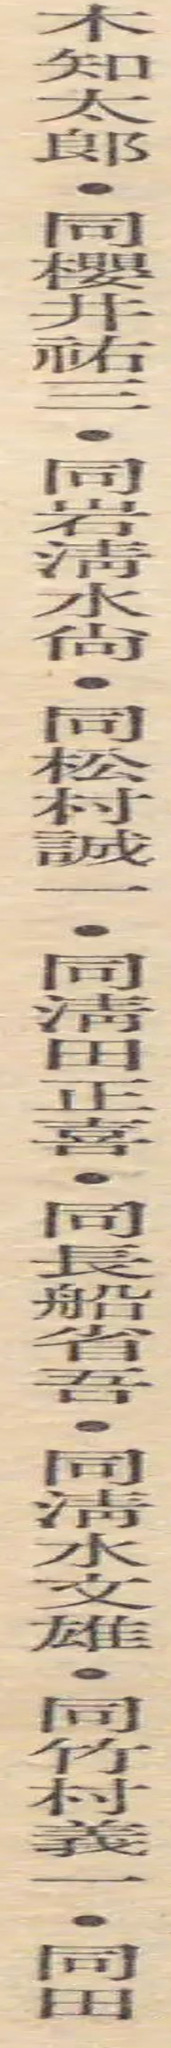木知太郎・同櫻井祐三・同岩淸水尚・同松村誠一・同淸田正喜・同長船省吾・同淸水文雄・同竹村義一・同田
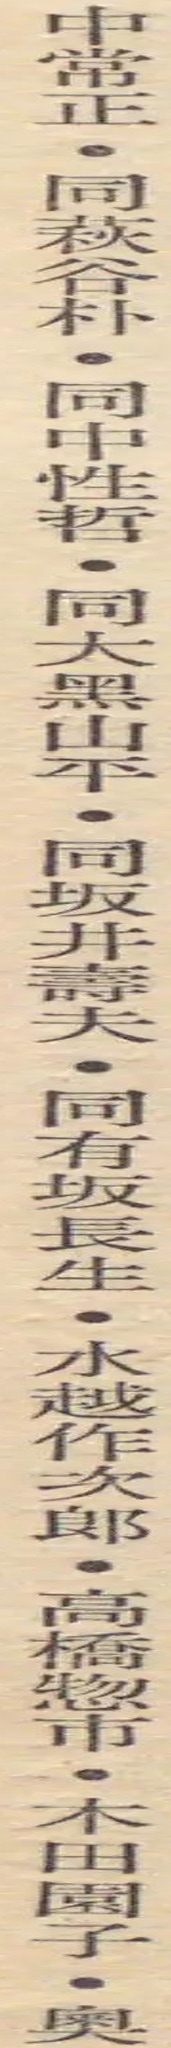中常正・同萩谷朴・同中性哲・同大黑山平・同坂井壽夫・同有坂長生・水越作次郎・高橋惣一・木田園子・奥
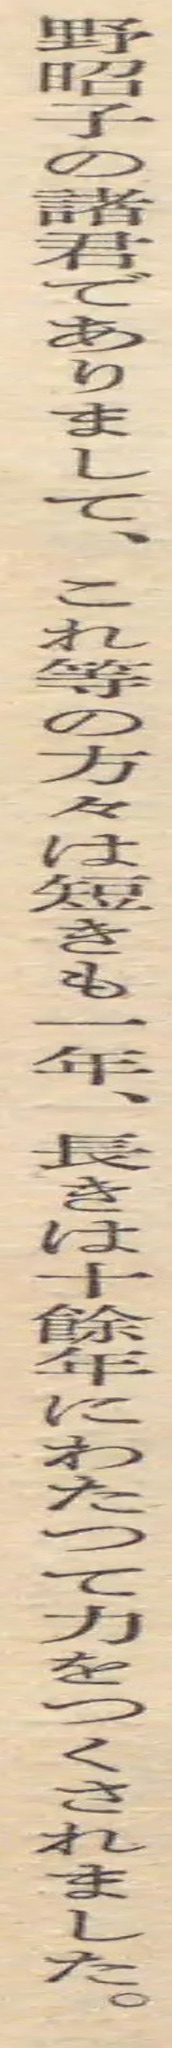野昭子の諸君でありまして、これ等の方々は短きも一年、長きは十餘年にわたつて力をつくされました。
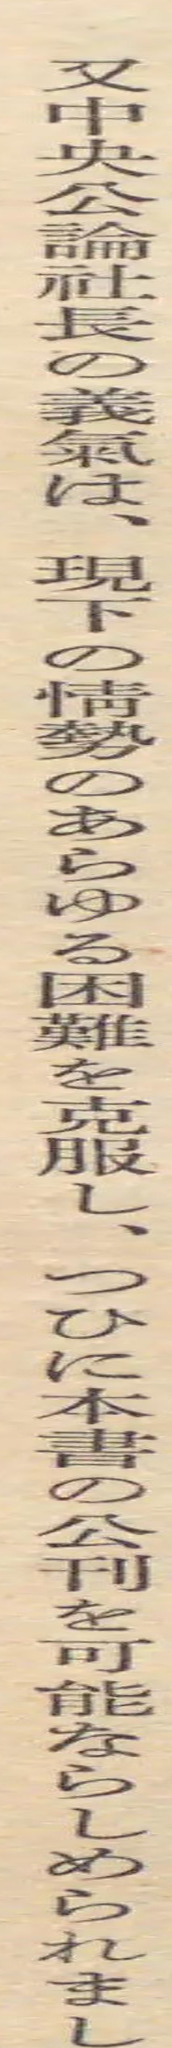又中央公論社長の義氣は、現下の情勢のあらゆる困難を克服し、つひに本書の公刊を可能ならしめられまし
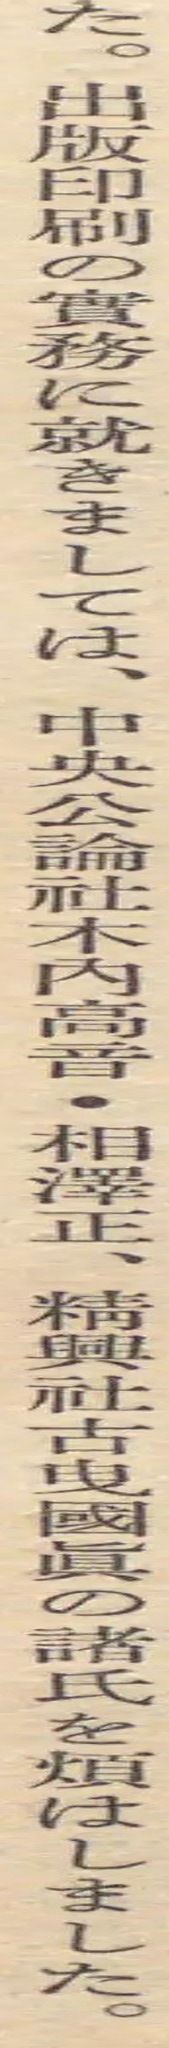た。出版印刷の實務に就きましては、中央公論社木内高音・相澤正、精興社古曳國眞の諸氏を煩はしました。
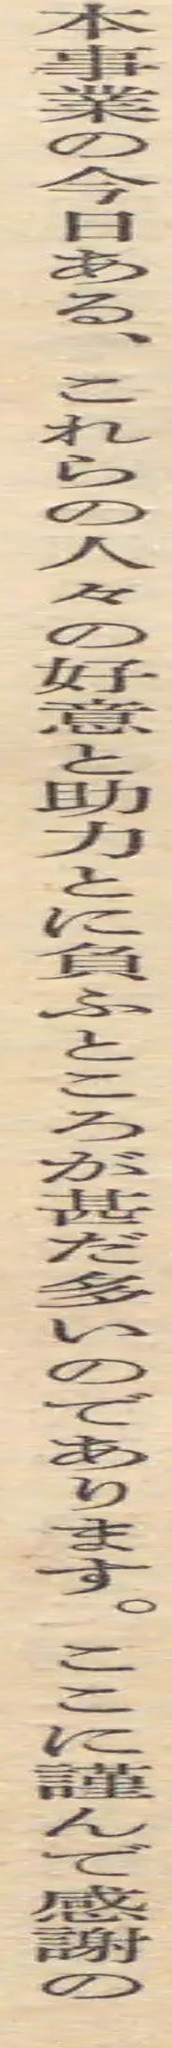本事業の今日ある、これらの人々の好意と助力とに負ふところが甚だ多いのであります。ここに謹んで感謝の
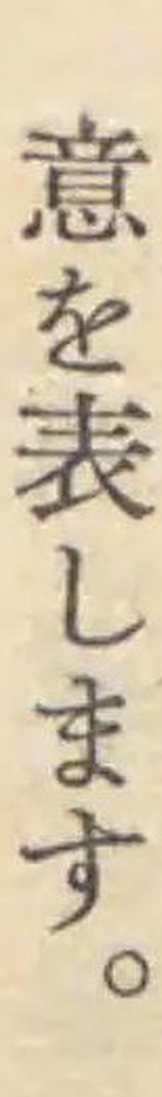意を表します。
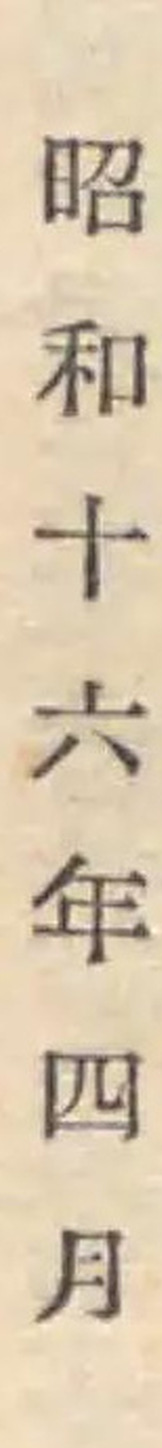昭和十六年四月
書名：校異源氏物語.
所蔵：国立国会図書館 National Diet Library, JAPAN
